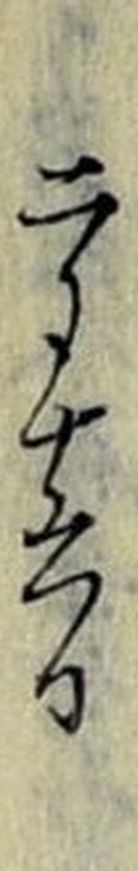二月十六日
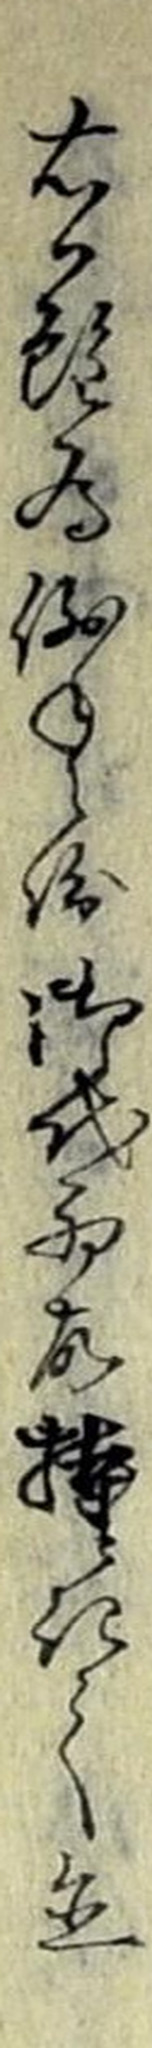右御雖為例年之儀御代初故特に記之置
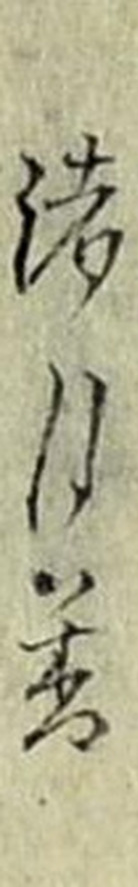諸月番
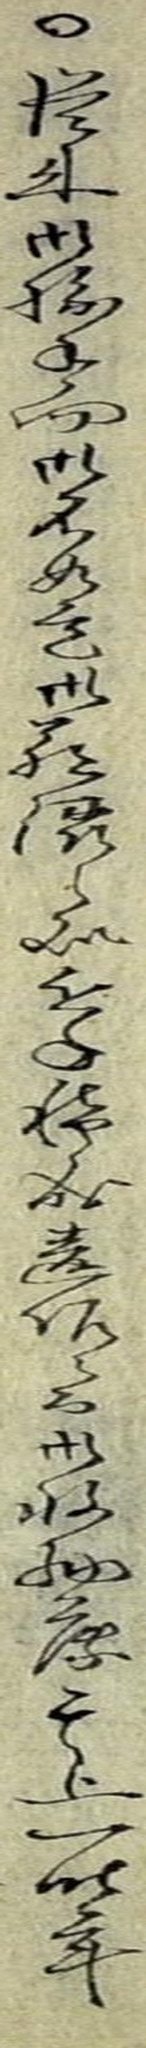〇従来御勝手向御不如意御難渋之処近年稀成違作に而御収納薄其上一昨年
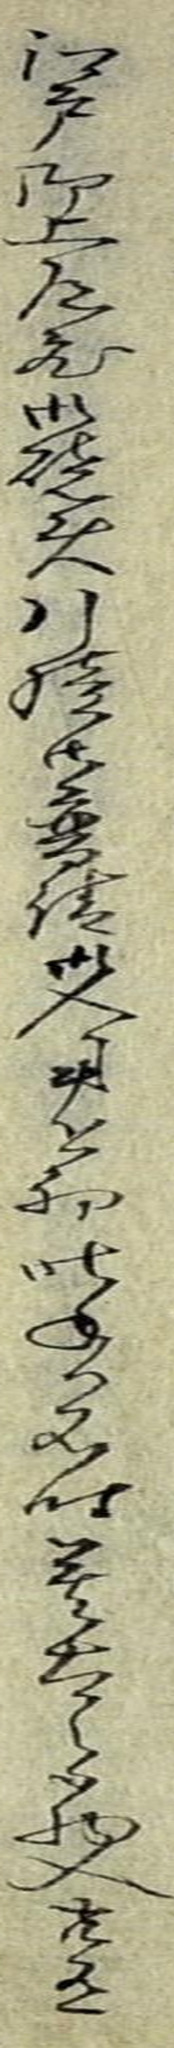江戸御上屋敷御焼失引続御普請御入用を初昨年は不時莫大之御物入共有
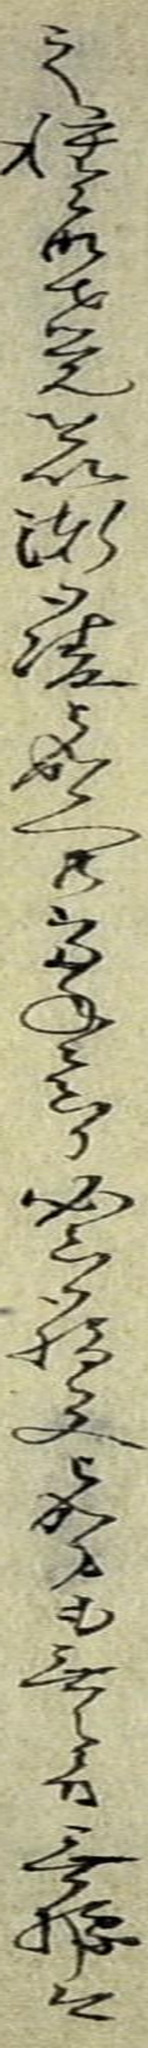之種々御才覚を以漸御凌被成候へ共当年に至り必至御指支被成方も無之に付無拠今
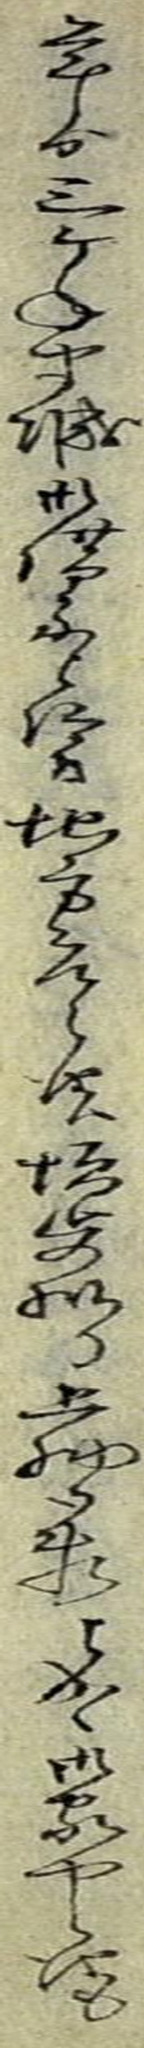年ゟ三ヶ年半減御借米被仰付地方取之儀は増歩掛り上納御頼被成候御家中之儀も
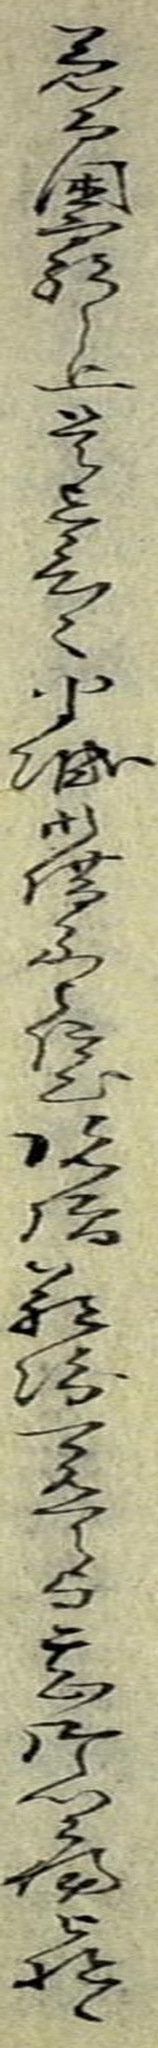兼而困窮之上是迄度々半減御借米被仰出弥増難儀可有之と甚御心傷被遊候
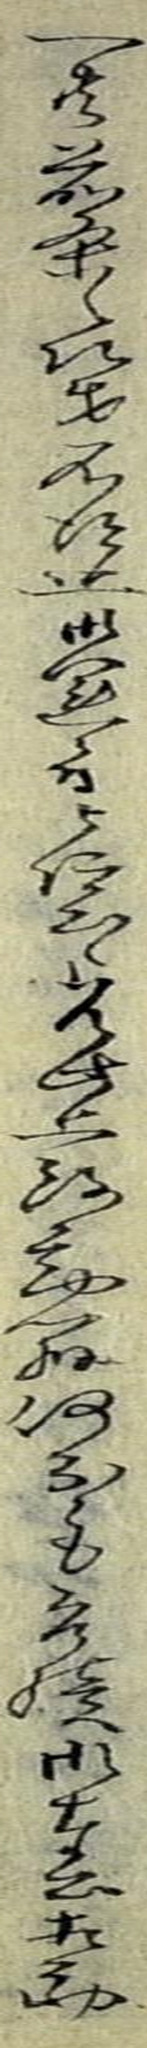へ共前条之次第不得止御運に付被仰出候乍此上致勘弁何分にも取続御奉公相勤
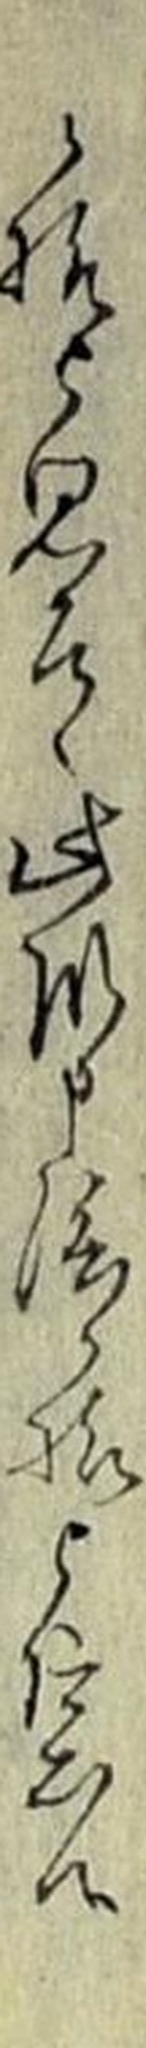候様被思召候此段申渡候様被仰出候
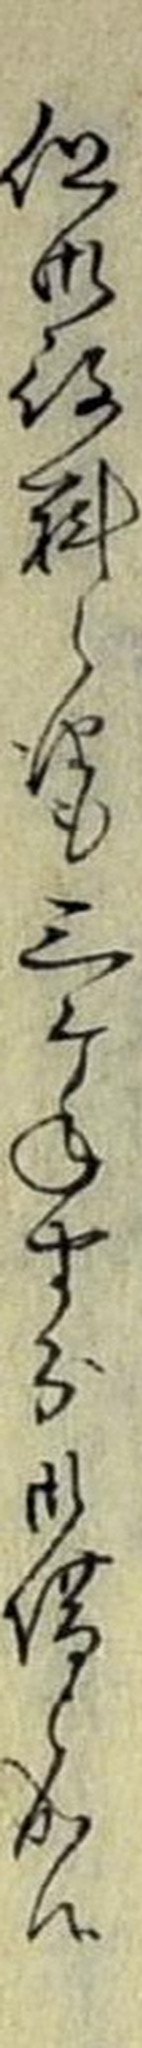但御役料之儀も三ヶ年半分御借被成候
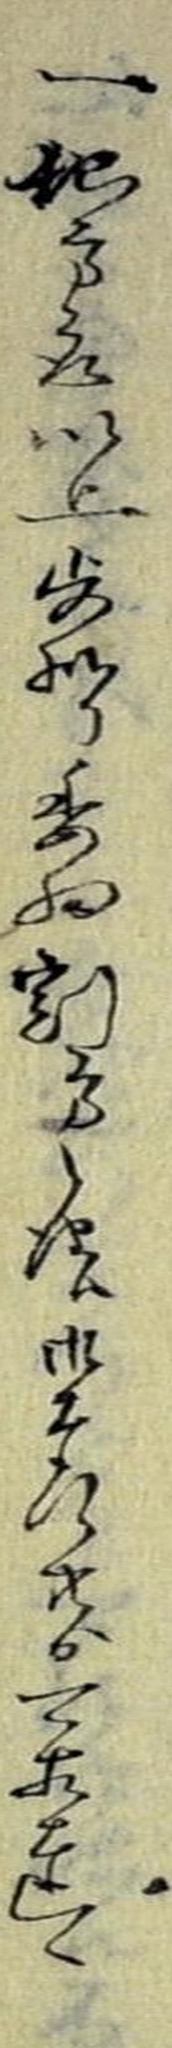一地方取以上歩掛り委細割方之儀は御奉行共ゟ可相達候
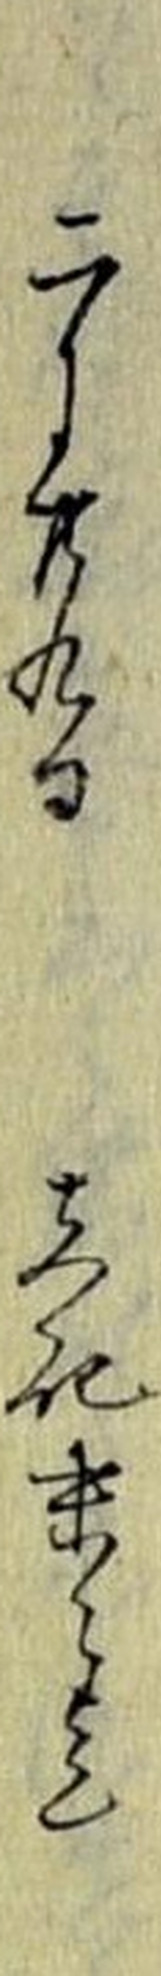二月廿九日支配末々迄
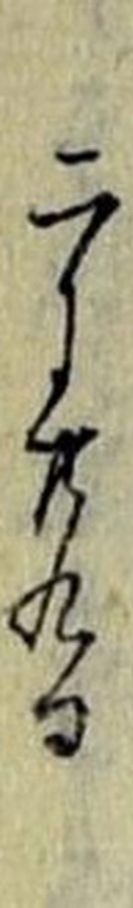二月十六日
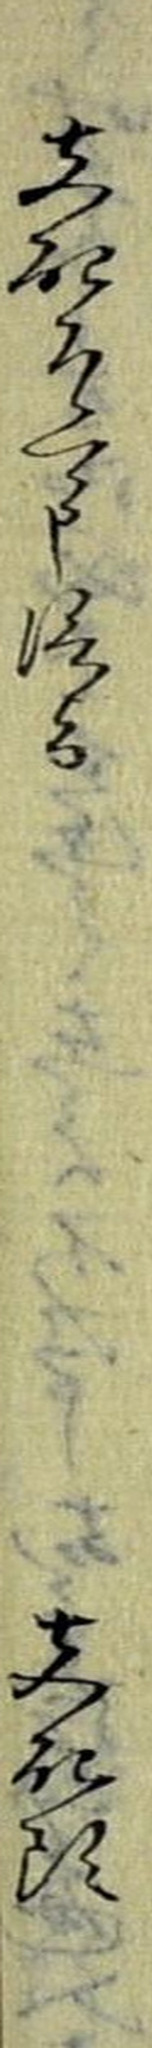支配下へ可申渡旨支配頭
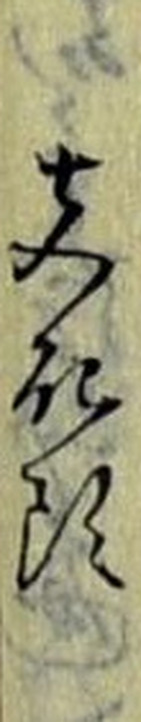支配頭
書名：命令之部 六
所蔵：福井県文書館 Fukui Prefectural Archives
